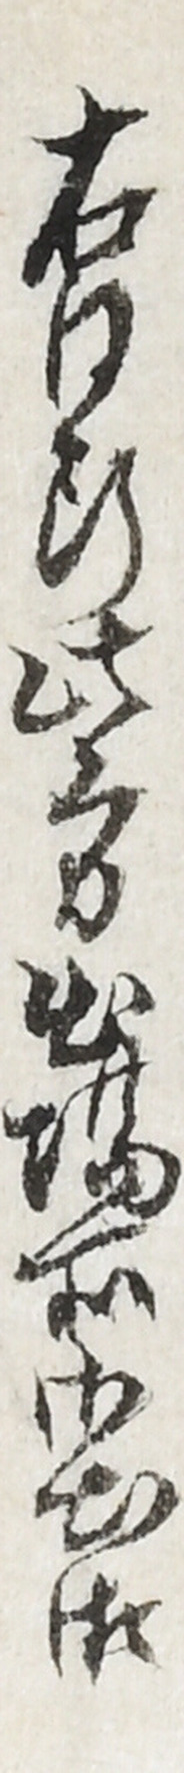右同断此方出場所御出御
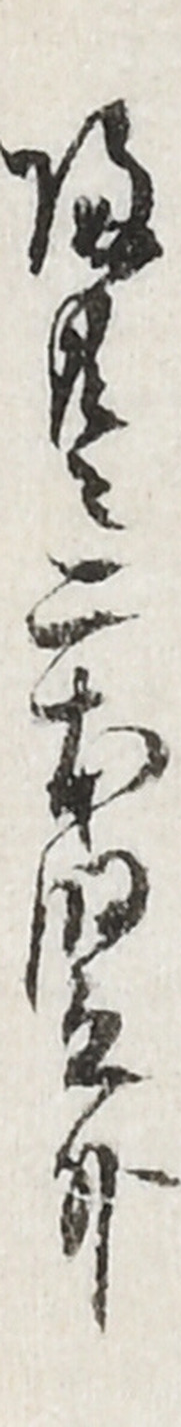帰共ニ二本竪外
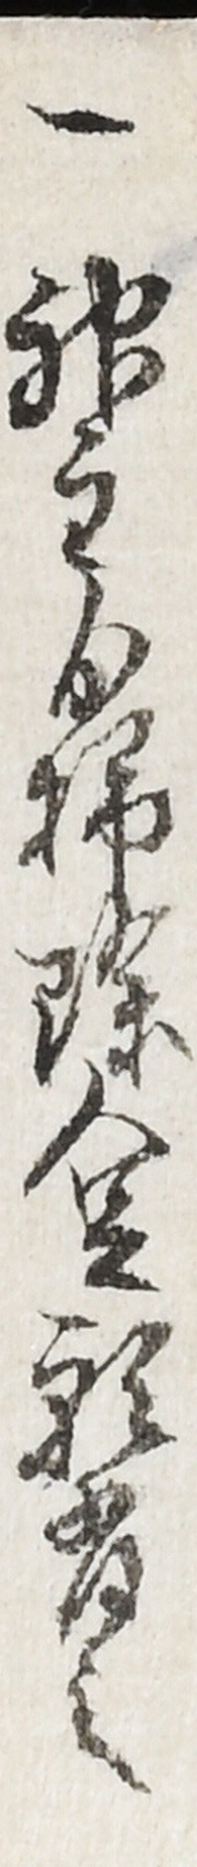一神主より掃除人足願有之
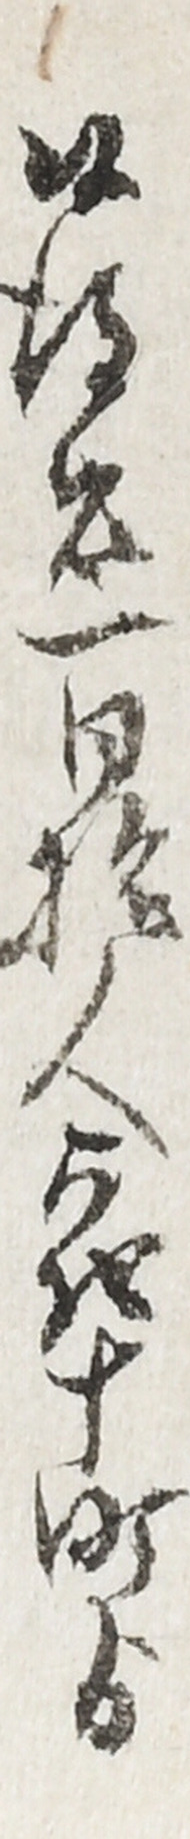候得者一日拾人与地十町より
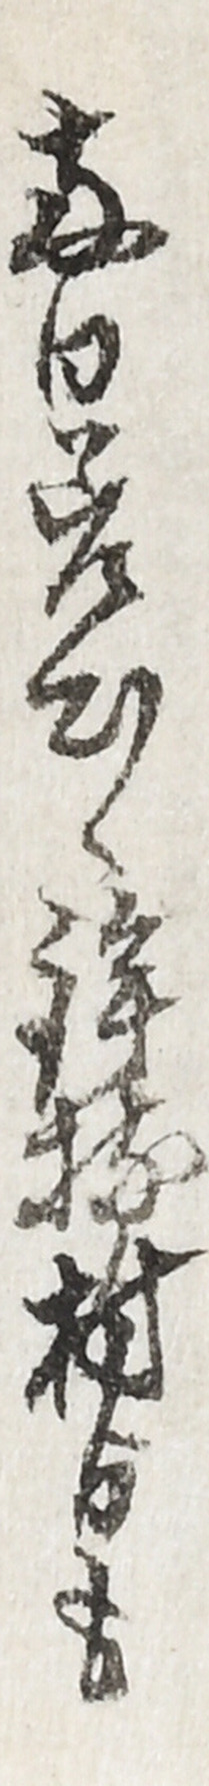両日差出候鉾持村よりも
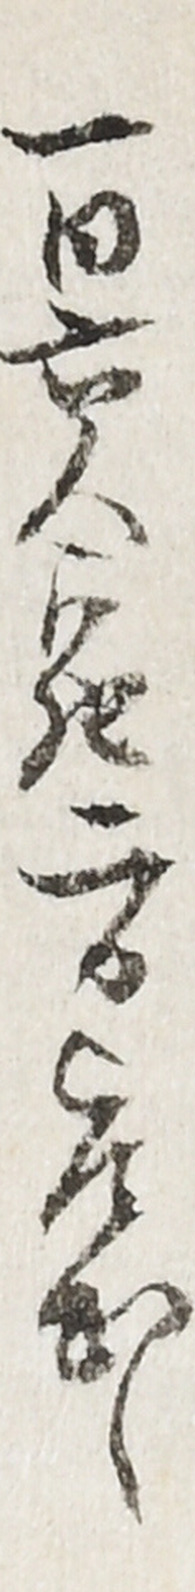一日六人宛二日差出候
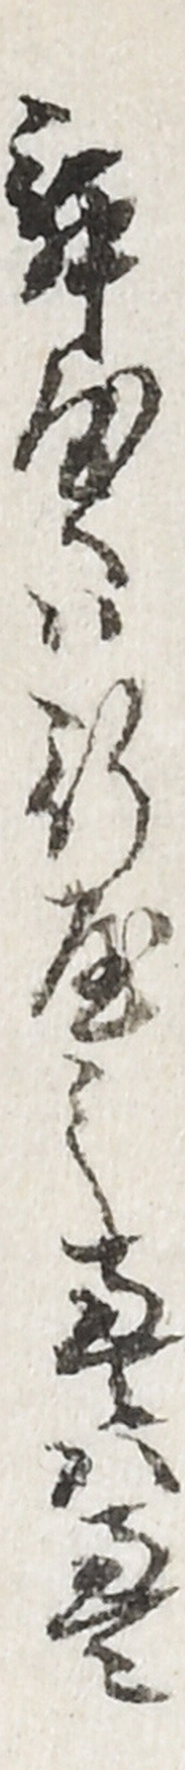舞屋へハ行屋之畳八畳
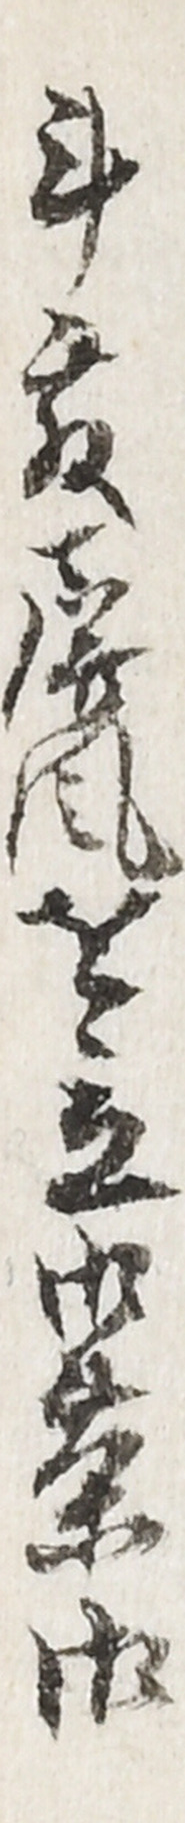計敷屏風を立御茶御
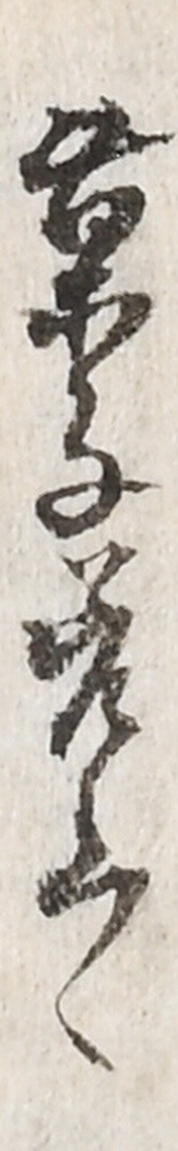菓子差上候
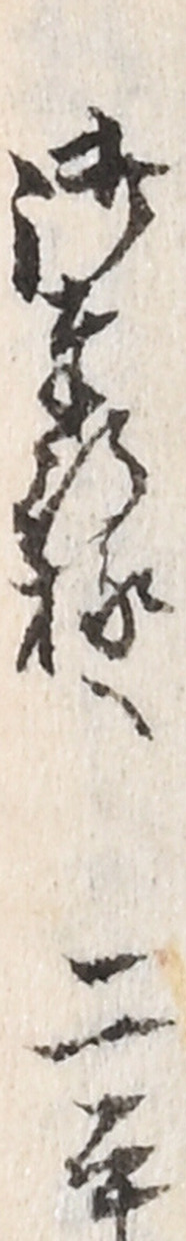御奉行様へ二重
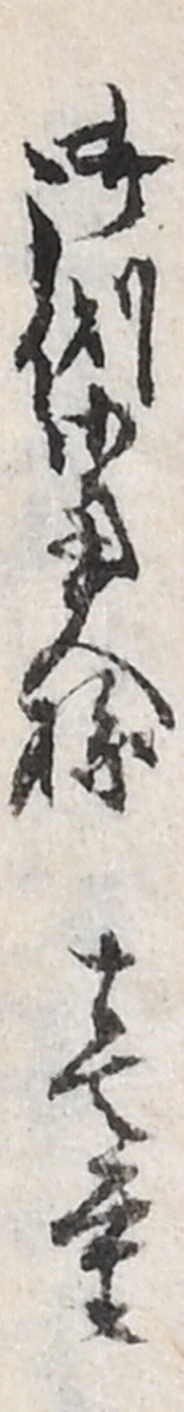御側御用人様壱重
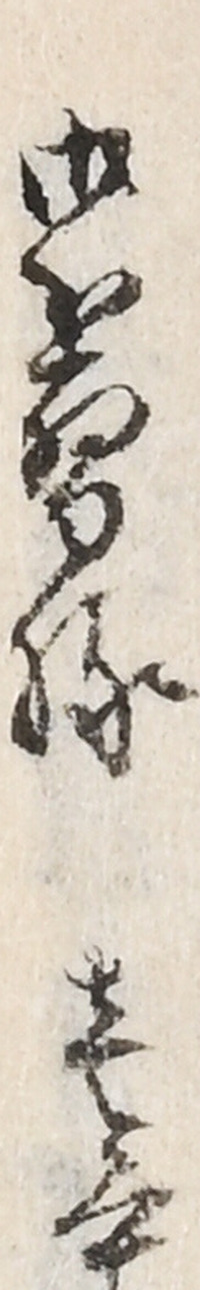御近習様壱重
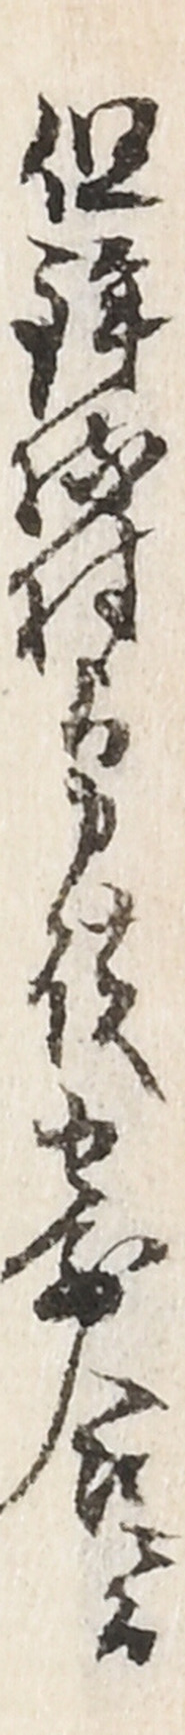但鉾持村より申談寄合ニ而
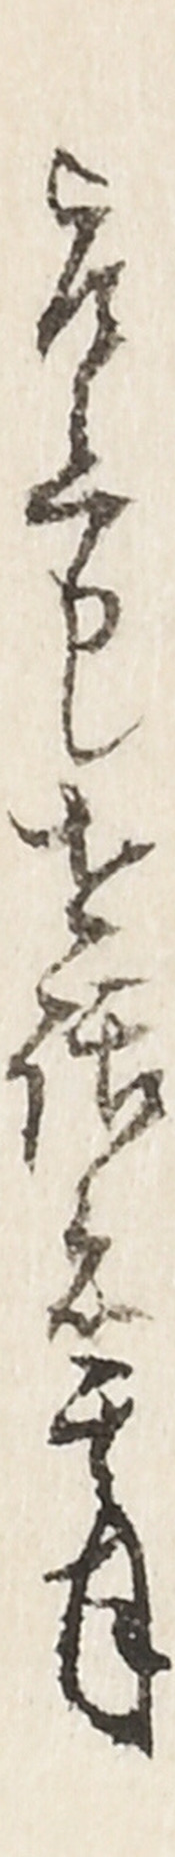差上申候世話は其月
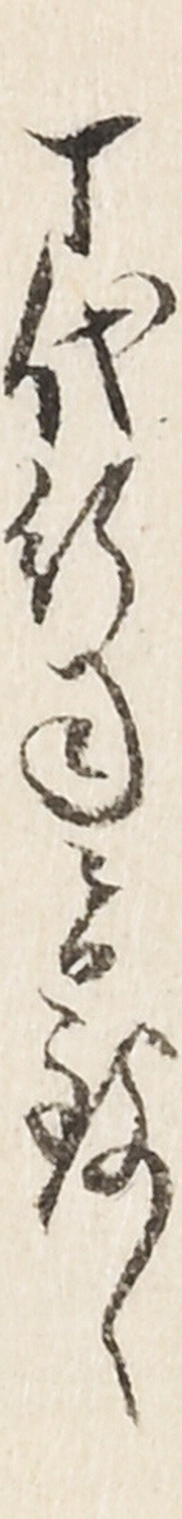丁代行司ニ而致候
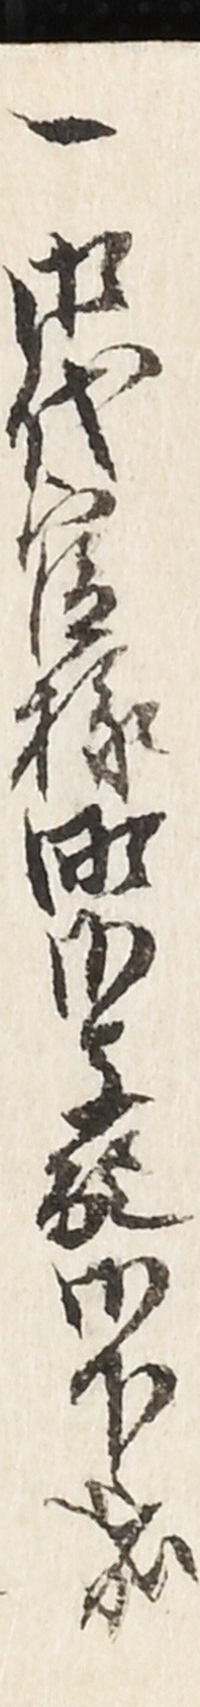一御代官様町御支配御下被成
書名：年内行事懐中録
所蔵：伊那市立高遠町図書館・合同会社AMANE
